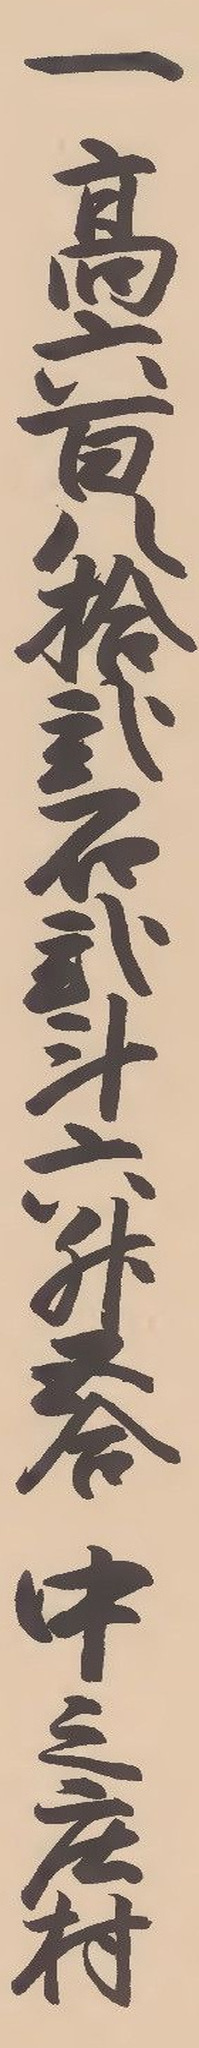一高六百八拾弐石弐斗六升五合中之庄村
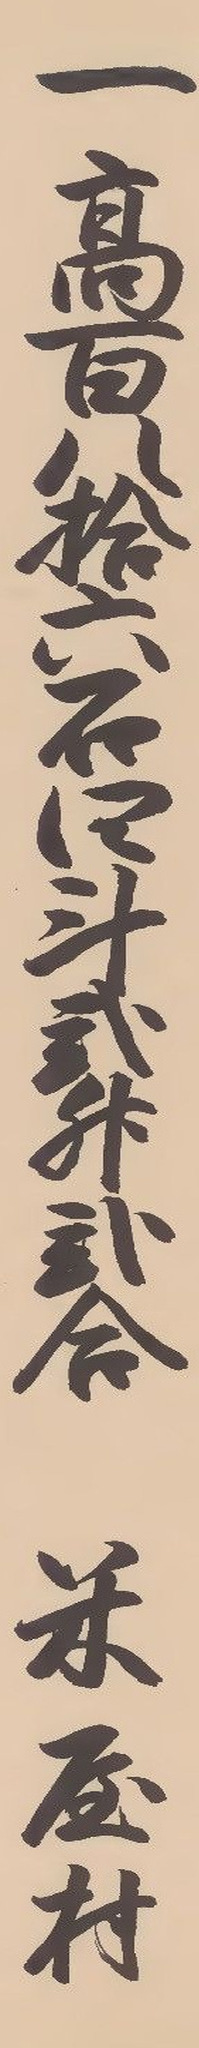一高百八拾六石四斗弐升弐合米屋村
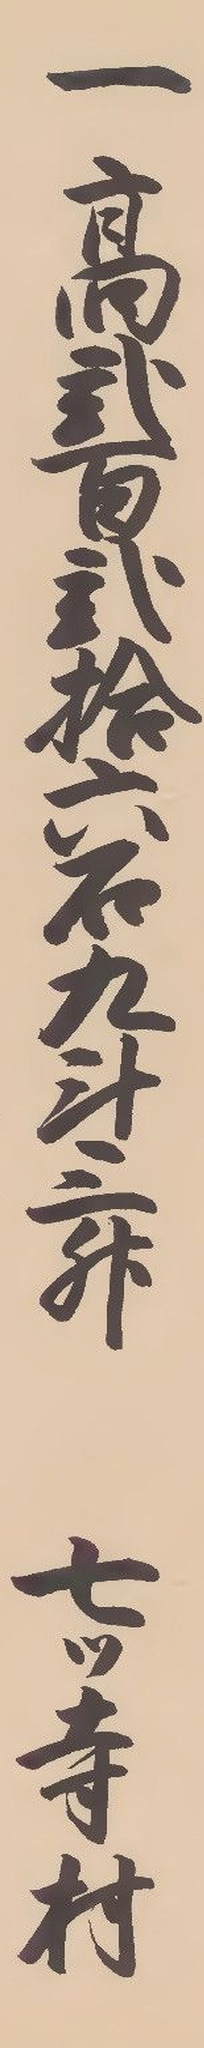一高弐百弐拾六石九斗三升七ツ寺村
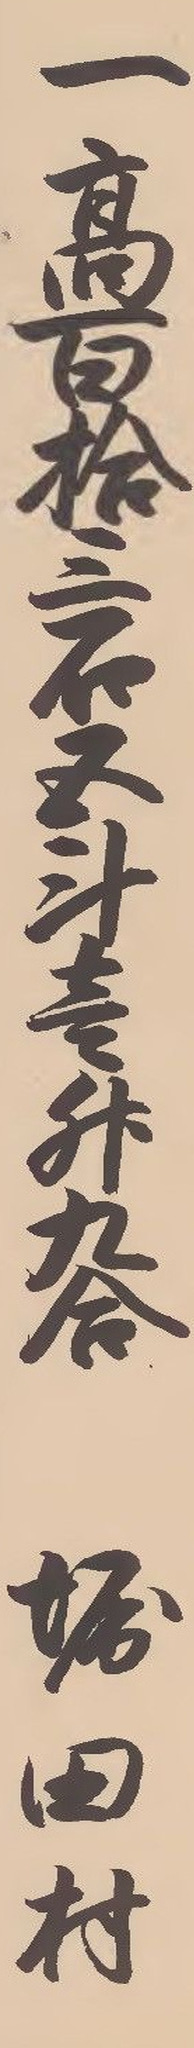一高百拾三石五斗壱升九合堀田村
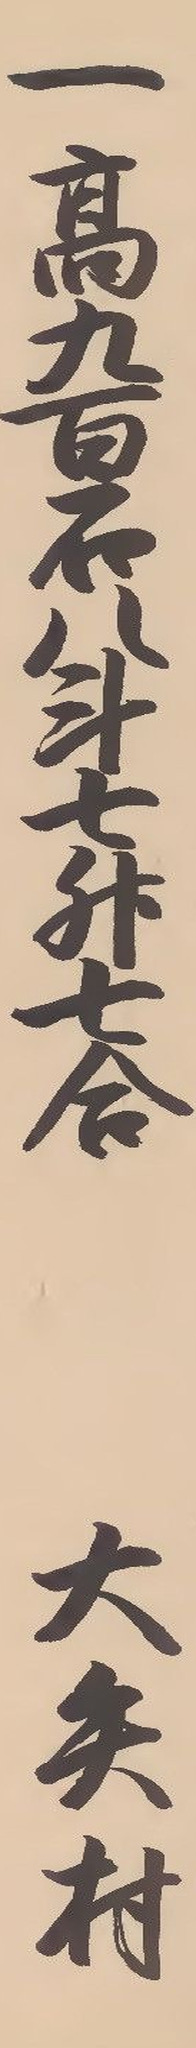一高九百石八斗七升七合大矢村
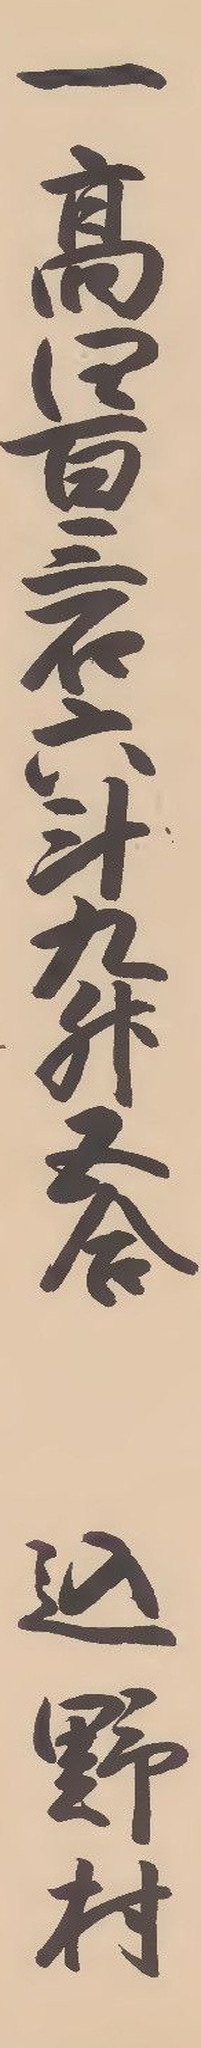一高四百三石六斗九升五合込野村
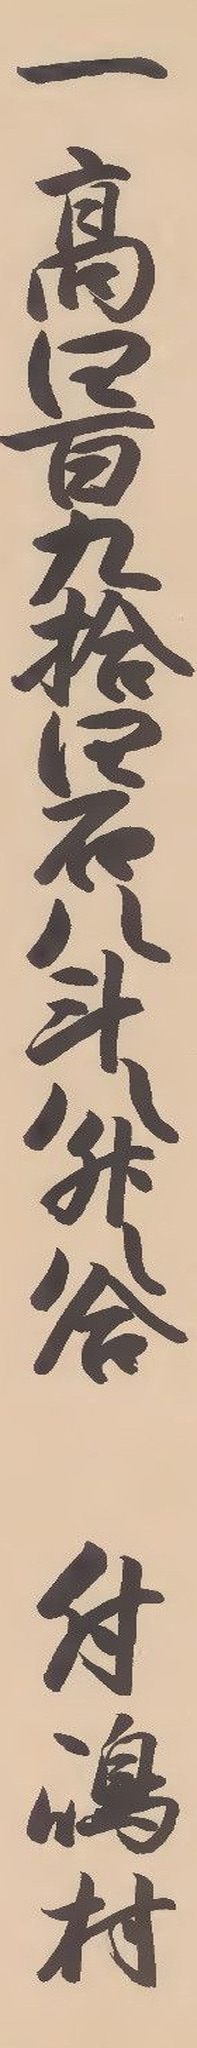一高四百九拾四石八斗八升八合付島村
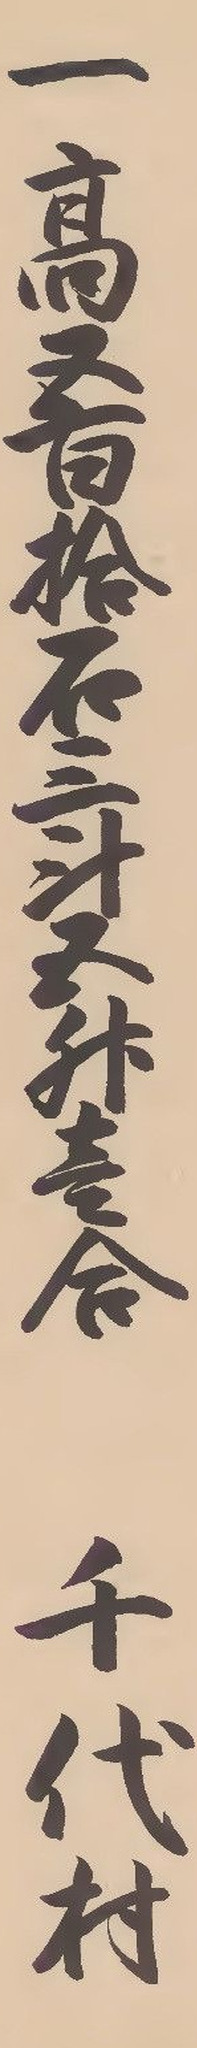一高五百拾石三斗五升壱合千代村

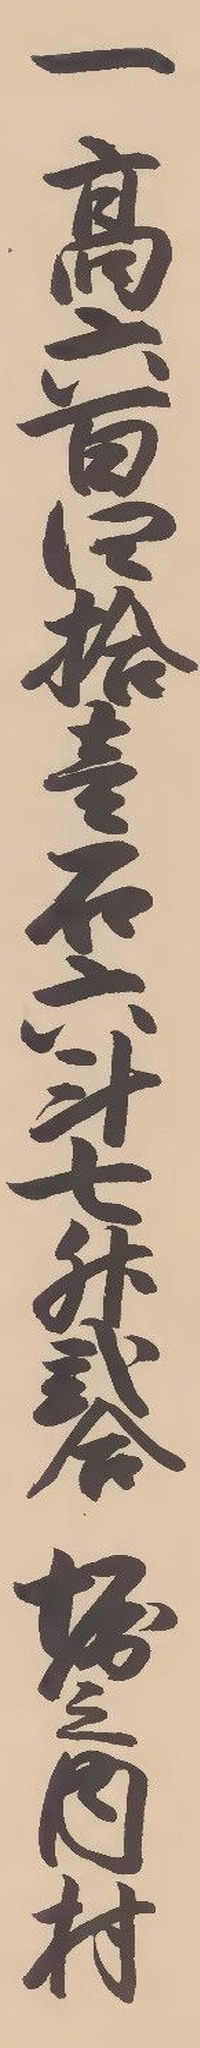一高六百四拾壱石六斗七升弐合堀之内村
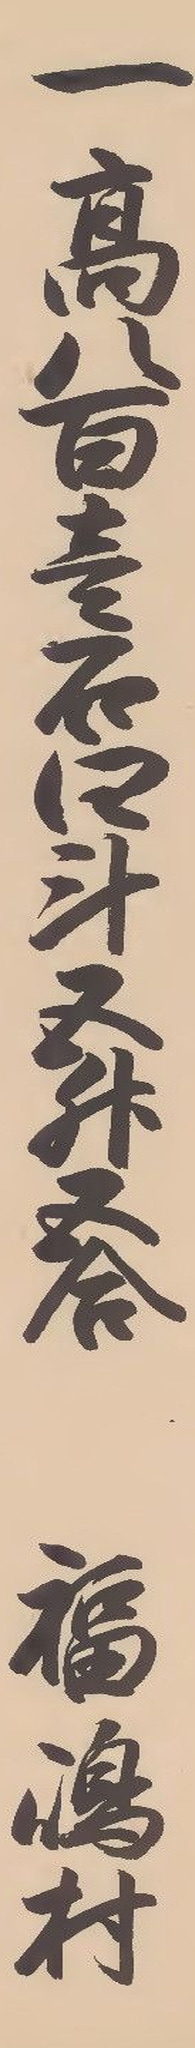一高八百壱石四斗五升五合福島村
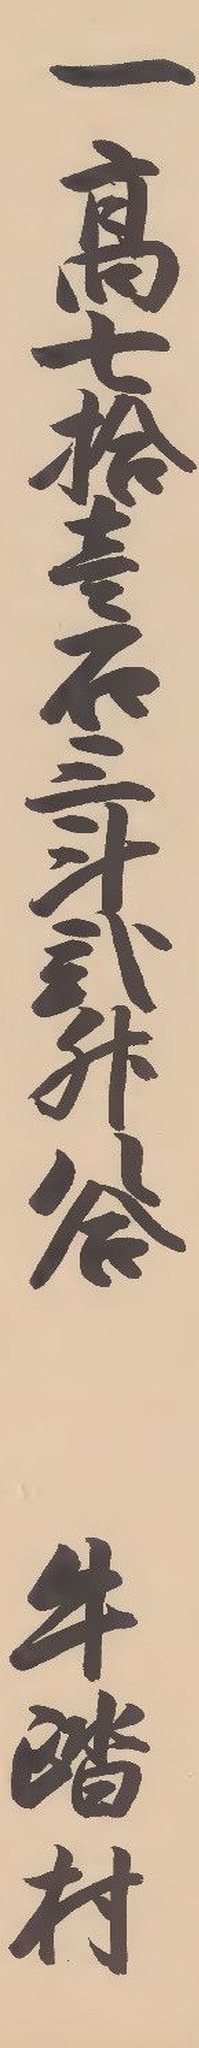一高七拾壱石三斗弐升八合牛踏村
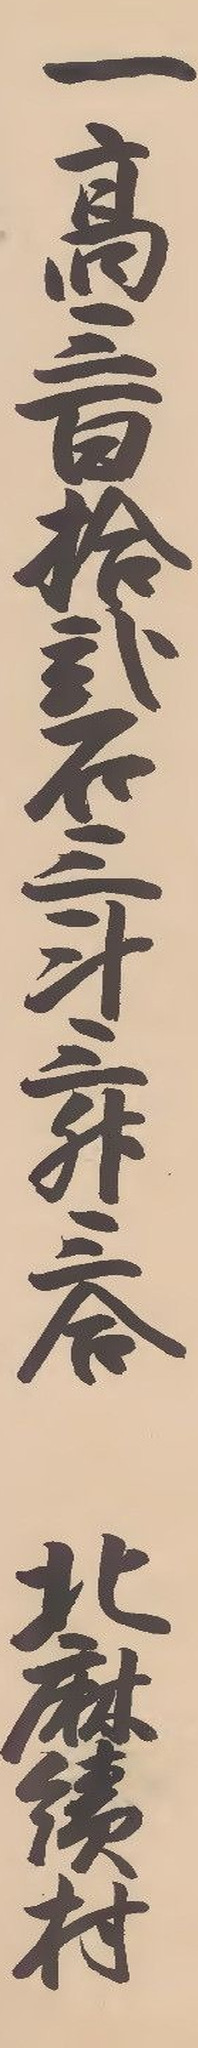一高三百拾弐石三斗三升三合北麻績村
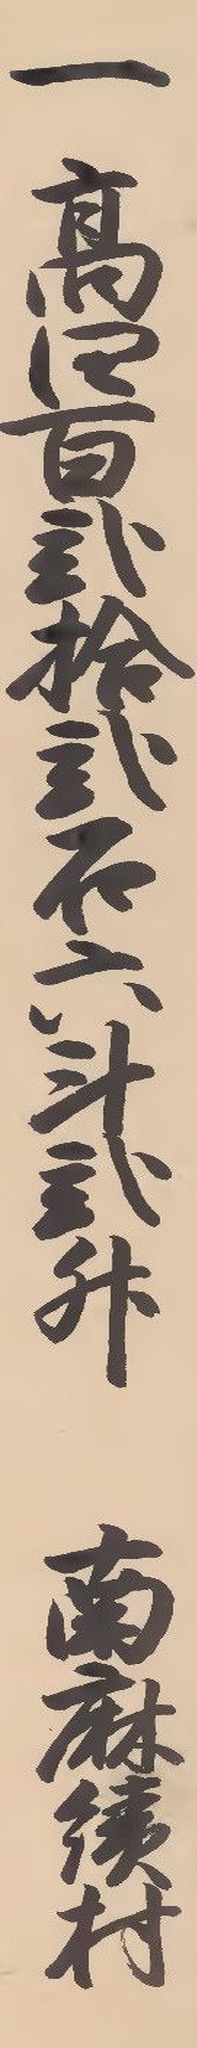一高四百弐拾弐石六斗弐升南麻績村
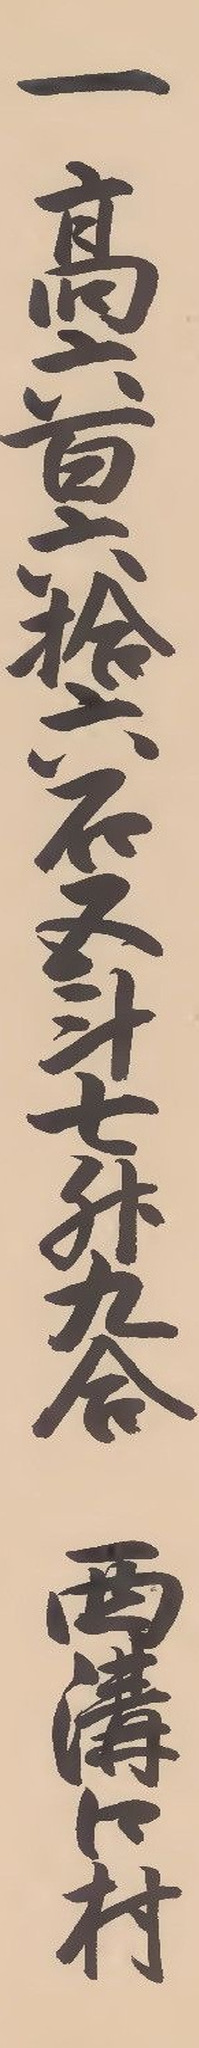一高六百六拾六石五斗七升九合西溝口村
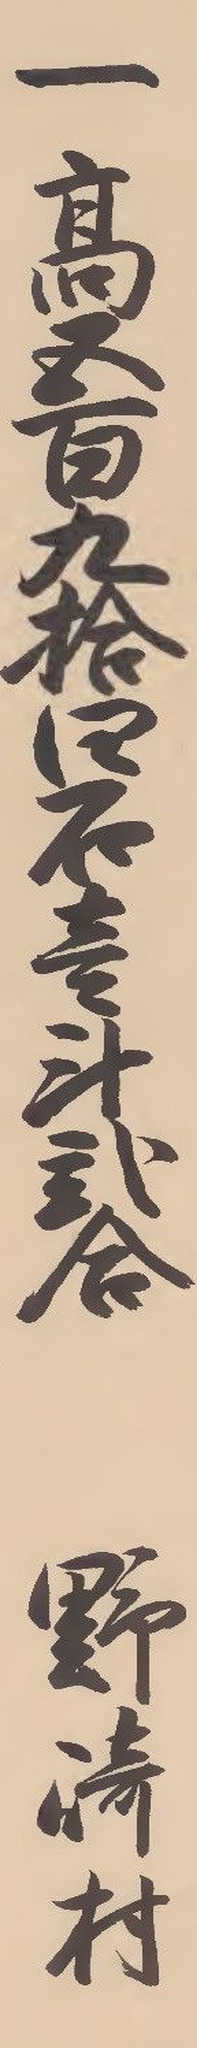一高五百九拾四石壱斗弐合野崎村
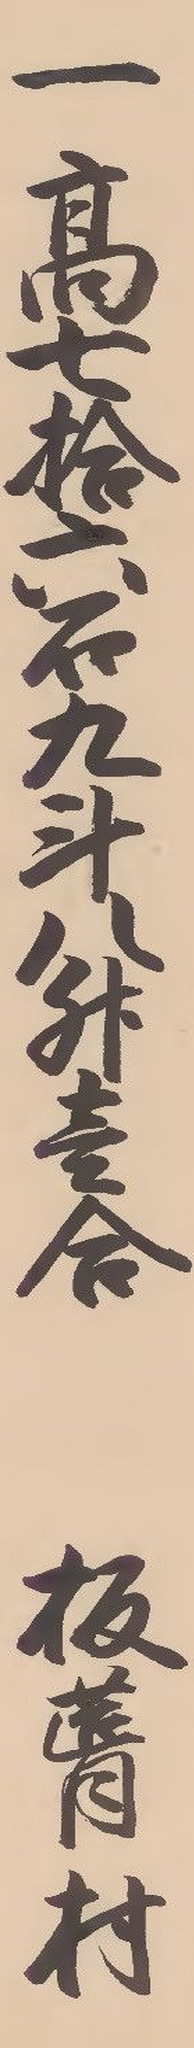一高七拾六石九斗八升壱合板葺村
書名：尾張国郷帳
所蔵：国立公文書館 National Archives of Japan
